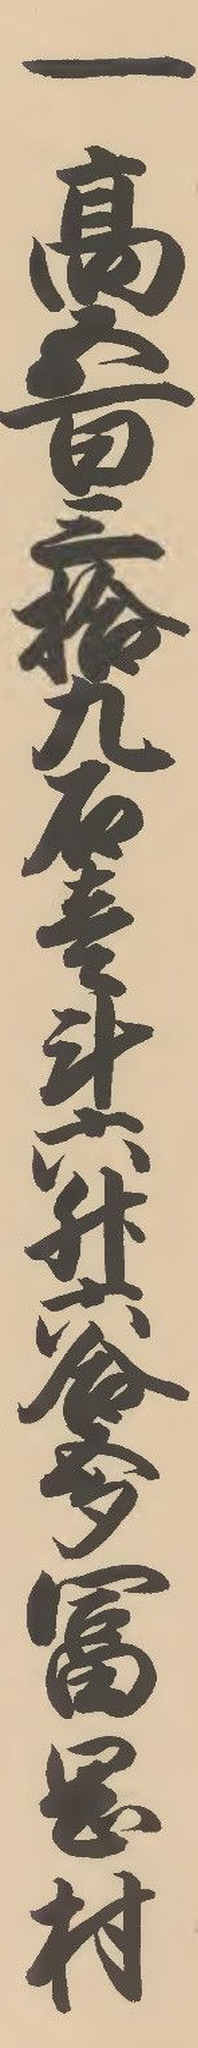一髙五百三拾九石壱斗六升六合五夕冨岡村
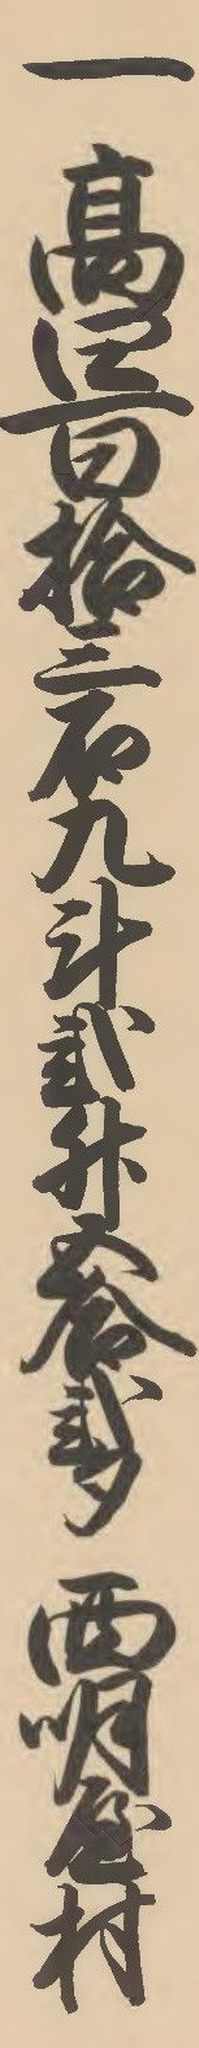一髙四百拾三石九斗弐升五合弐夕西明屋村
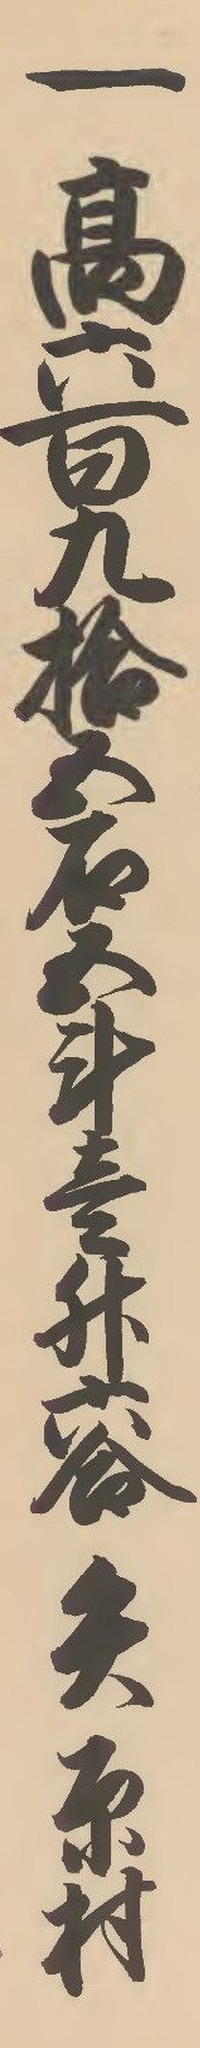一髙六百九拾五石五斗壱升六合矢原村

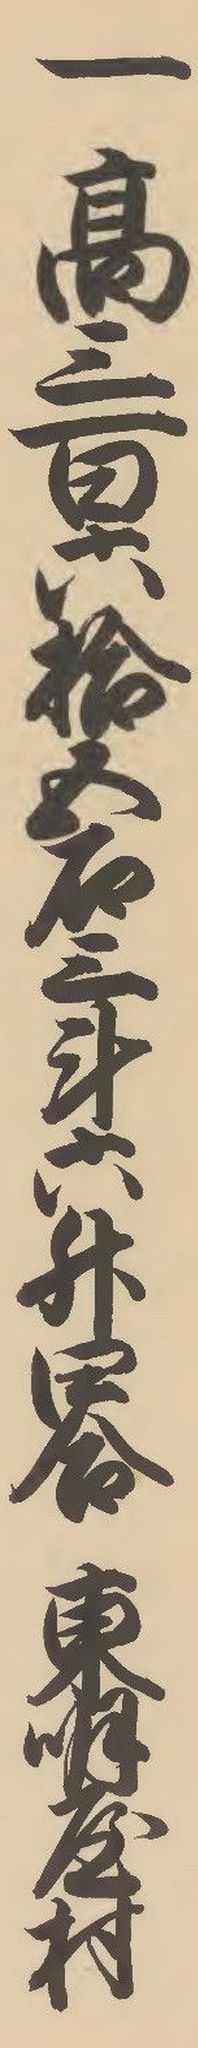一髙三百六拾五石三斗六升四合東明屋村
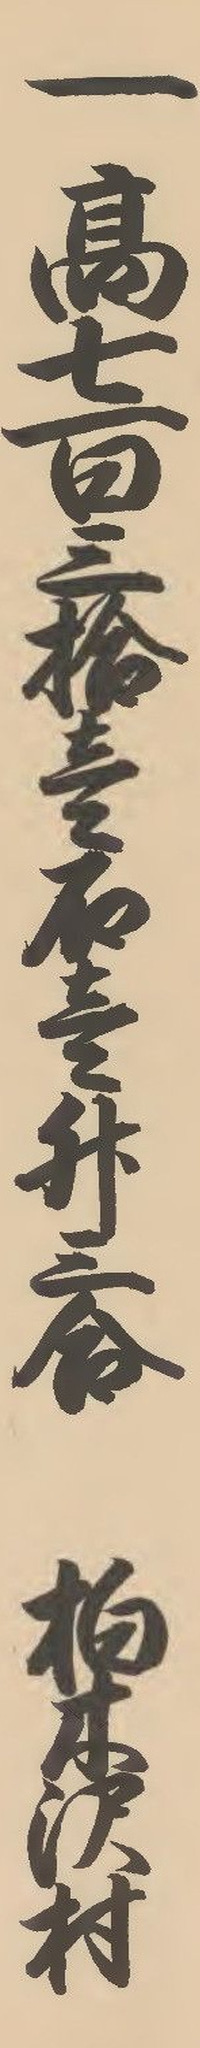一髙七百三拾壱石壱升三合柏木沢村
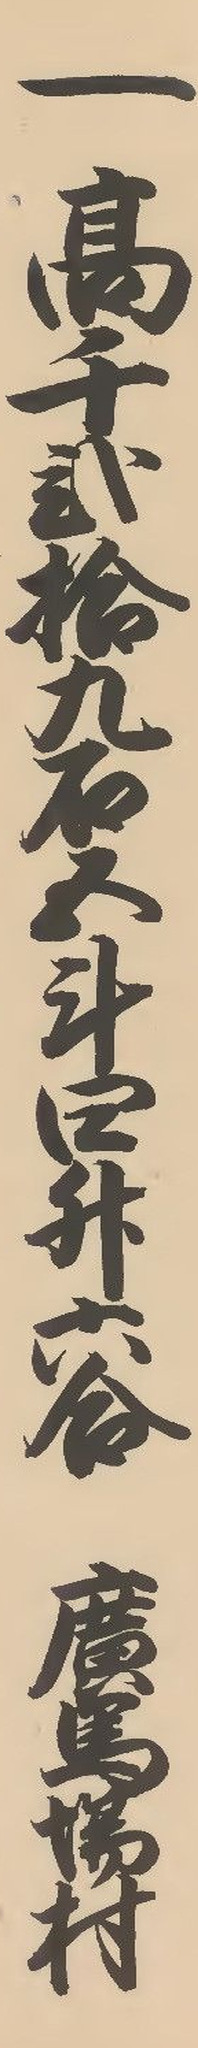一髙千弐拾九石五斗四升六合廣馬場村
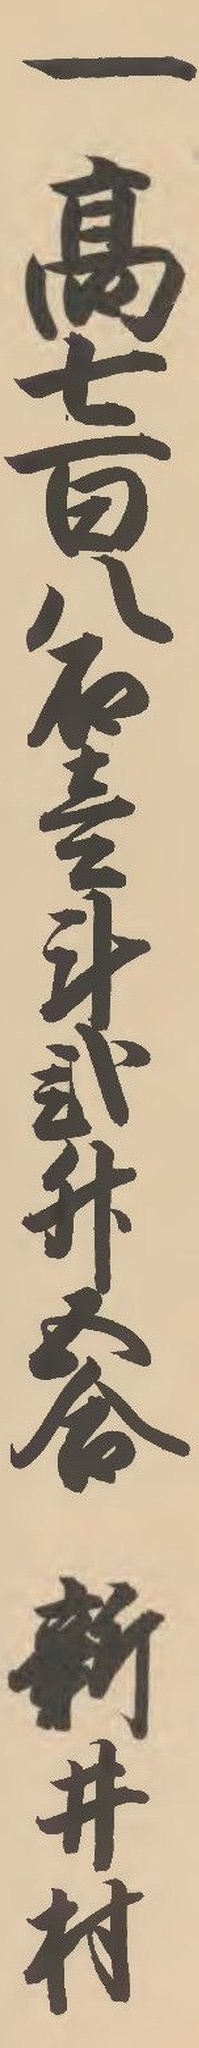一髙七百八石壱斗弐升五合新井村
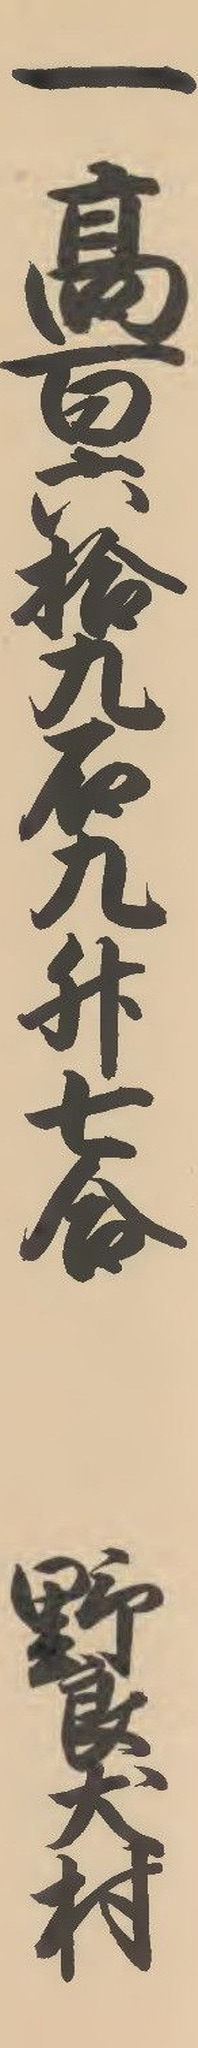一髙百六拾九石九升七合野良犬村
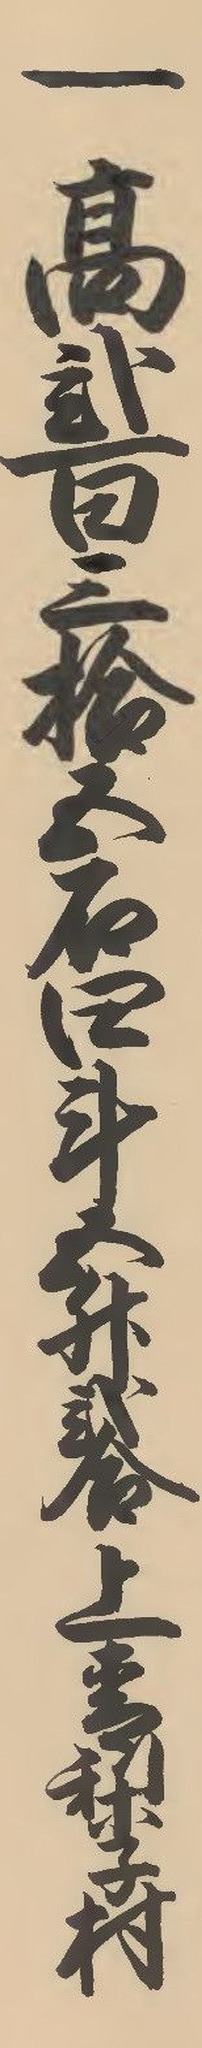一髙弐百三拾五石四斗五升弐合上青梨子村
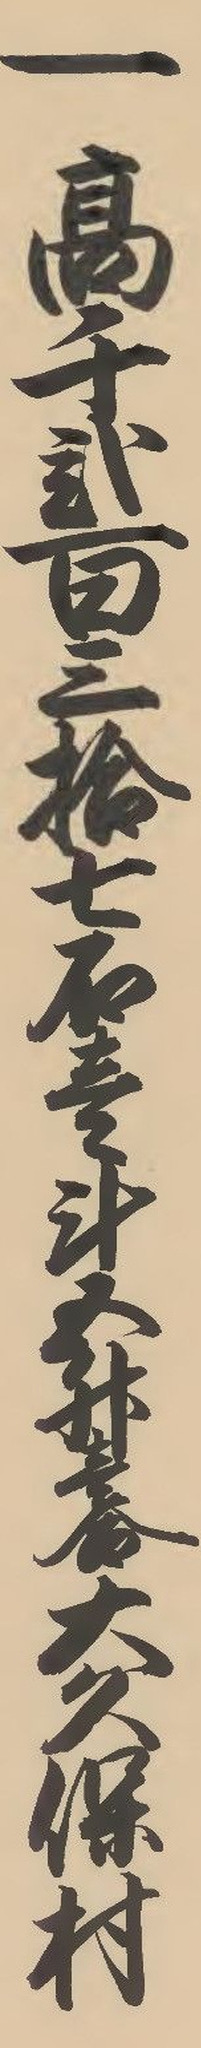一髙千弐百三拾七石壱斗五升壱合大久保村
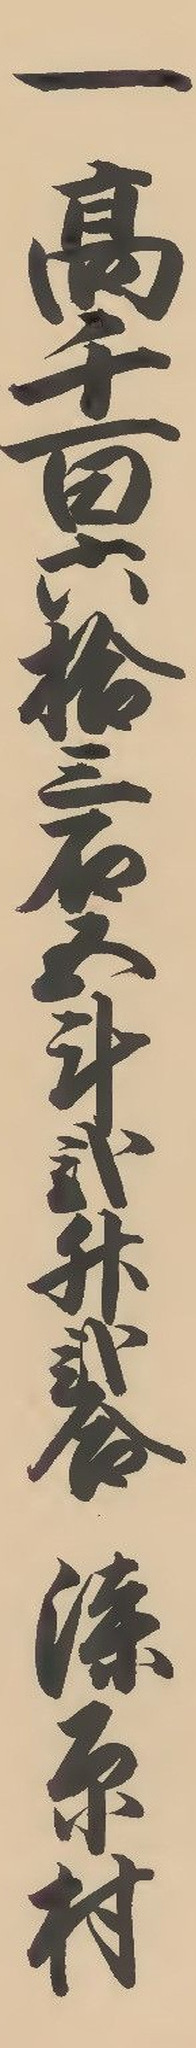一髙千百六拾三石五斗弐升弐合漆原村

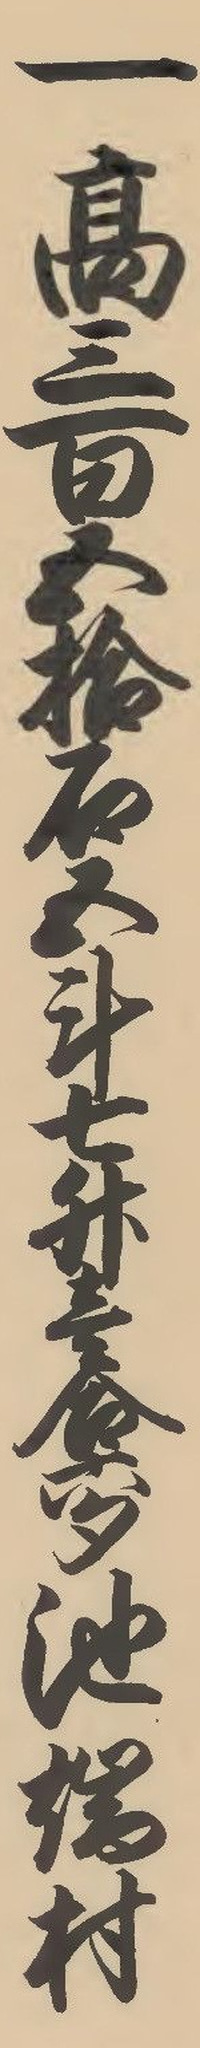一髙三百五拾石五斗七升壱合六夕池端村
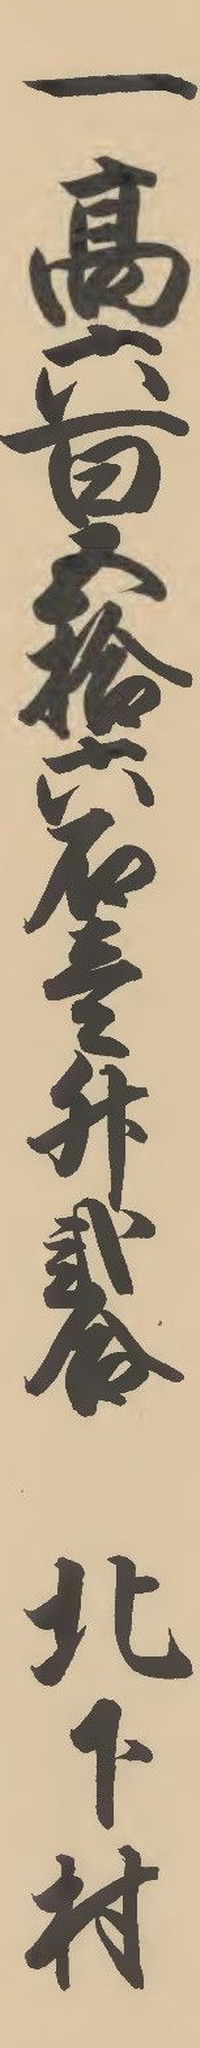一髙六百五拾六石壱升弐合北下村
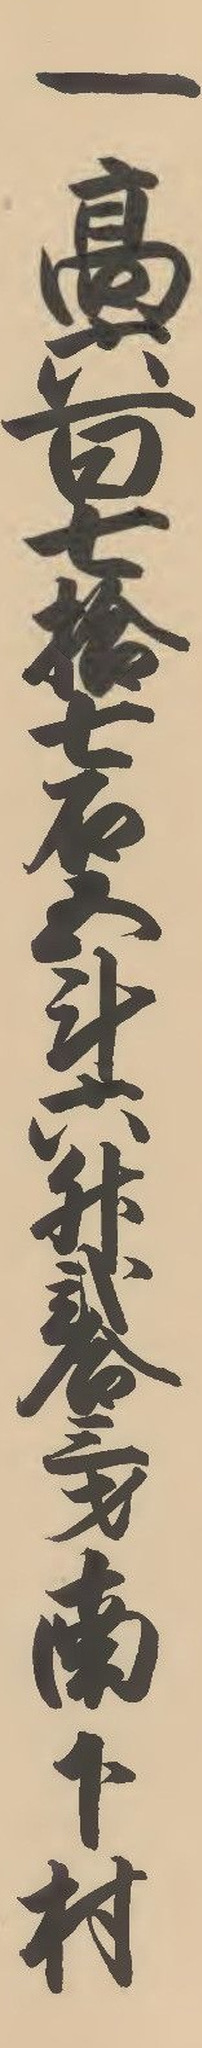一髙六百七拾七石五斗六升弐合三才南下村
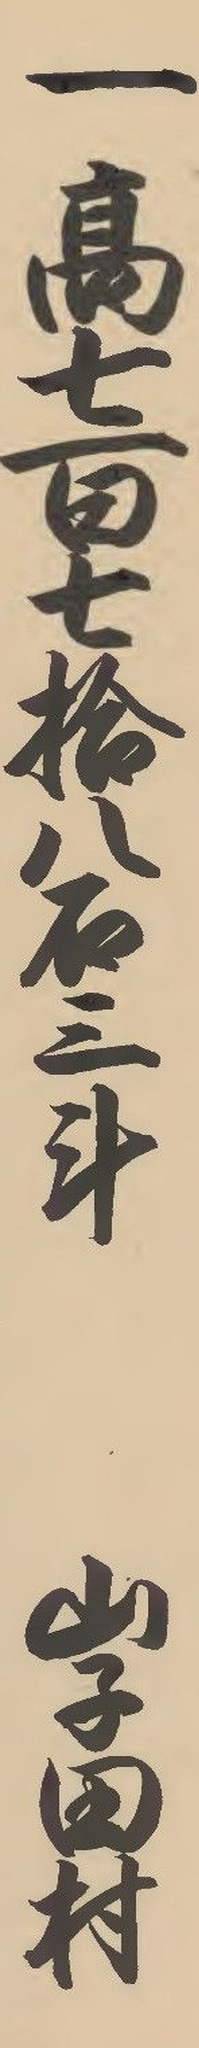一髙七百七拾八石三斗山子田村
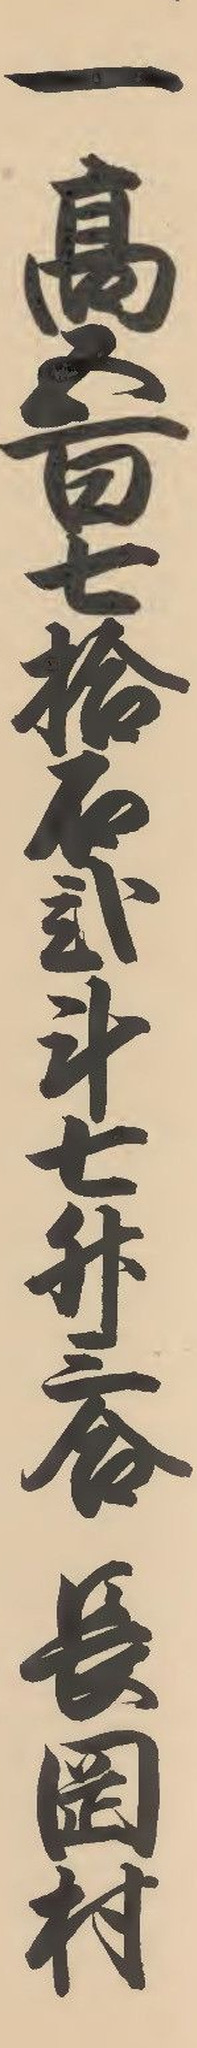一髙五百七拾石弐斗七升三合長岡村
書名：上野国郷帳
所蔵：国立公文書館 National Archives of Japan
